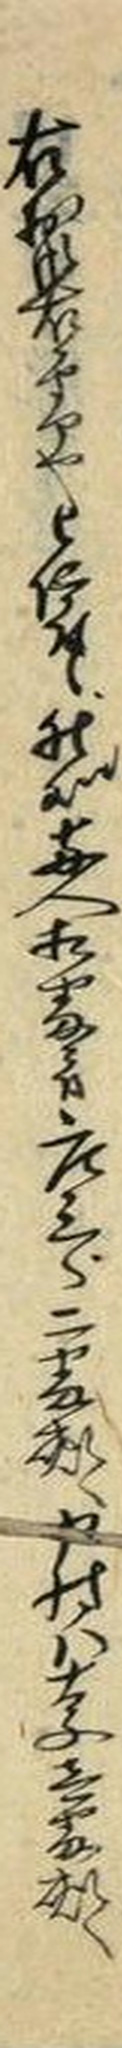右於御右筆部や被仰付候然処両人相番ニ付庄三郎二番頬へ中村八太夫壱番頬へ

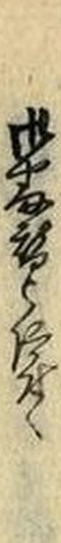御番替被仰付候
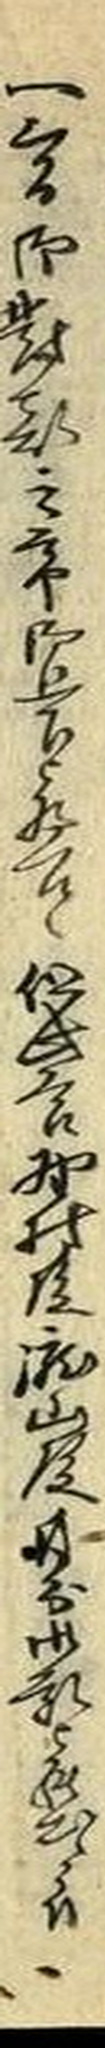一今日御対顔之節御上下被為召候但此節野村殿瀧山殿取分御歓被罷出候ニ付
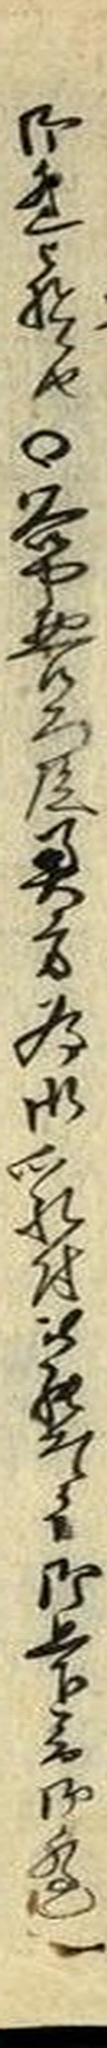御逢被遊候由○谷中惣左衛門殿奥方為御乳付被罷出候ニ付御上下ニ而御逢
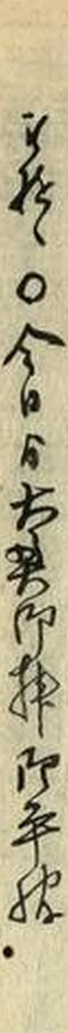被遊候○今日ゟ大奥御拝平服
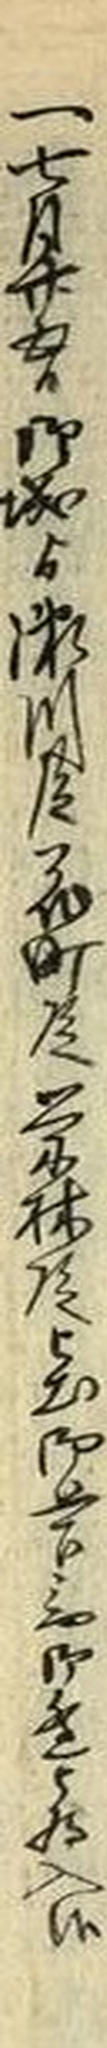一七月廿五日御城ゟ瀬川殿花町殿栄林殿被出御上下ニ而御逢被為入候
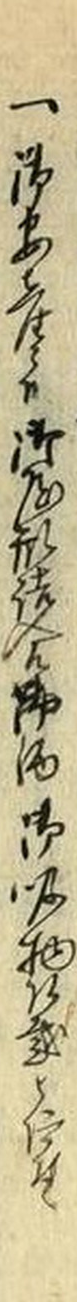一御安産ニ付御屋形詰合御酒御吸物頂戴被仰付候
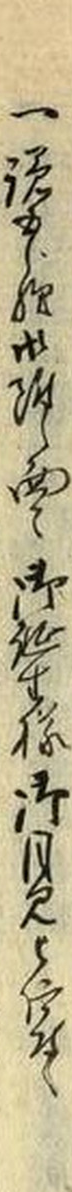一謙五郎様御附之面々御誕生様御目見被仰付候
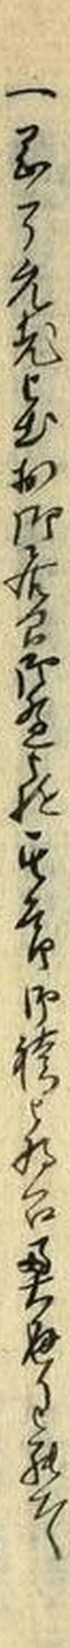一岡了允老被出於御居間御逢被遊其節御袴被為召奥大通り被罷出候
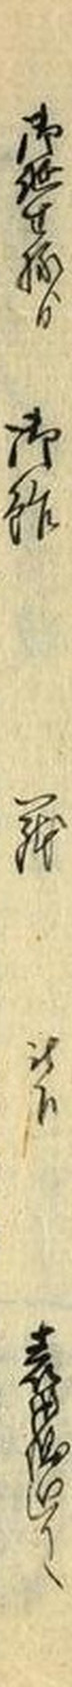御誕生様ゟ御鮓一鉢被下表御側廻りへ
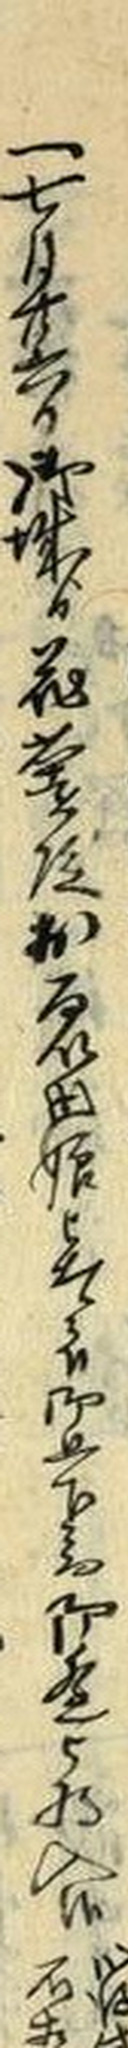一七月廿五日御城ゟ瀬川殿花町殿栄林殿被出御上下ニ而御逢被為入候
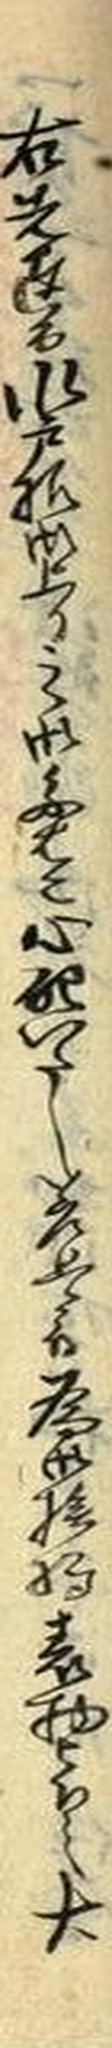右先達而水戸様御上り之御たはこ心配いたし差上候付為御挨拶表物被下之大
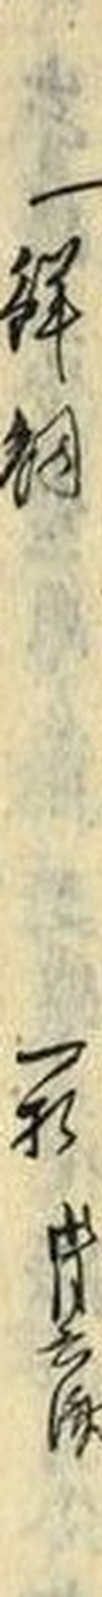鮮鯛一折御目六済
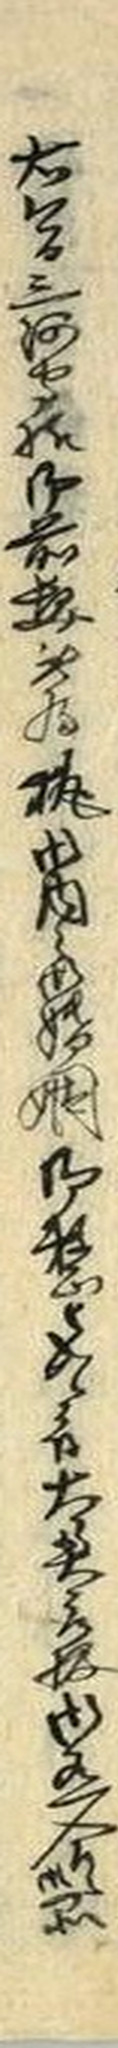右今日三河守様御前髪被為執御内々御婚姻御整被成候ニ付大奥取扱御有合候御品
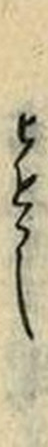被進之
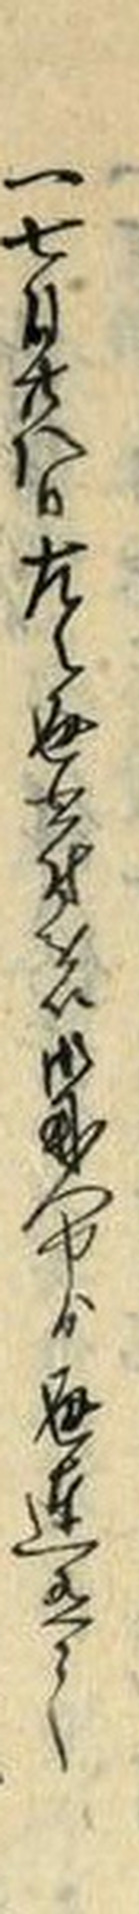一七月廿八日左之通書付を以御用人中ゟ通達有之
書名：少傅日録抄（斉承付側向頭取日記、在府）
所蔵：福井県文書館 Fukui Prefectural Archives
